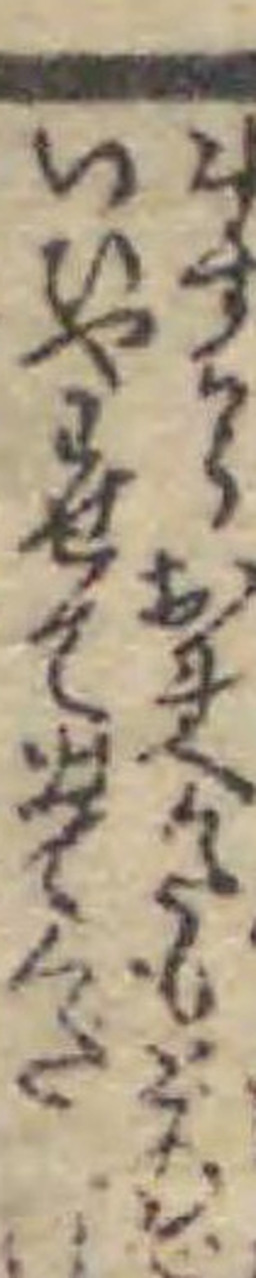いひやわせて出てくた
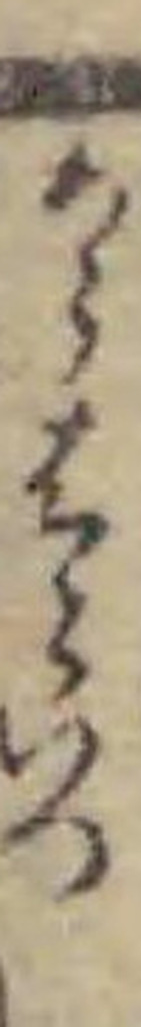からはといつ
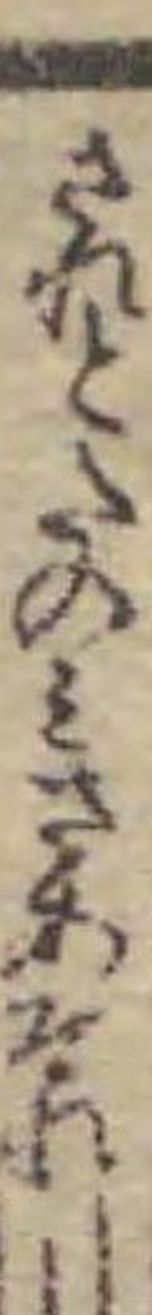されとたのみさあそれ
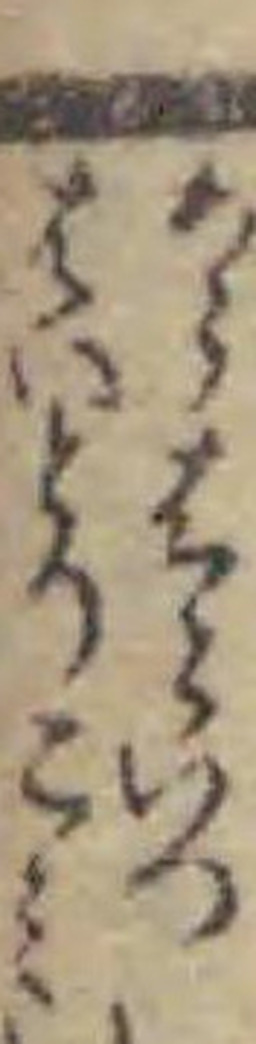はいとりこみ
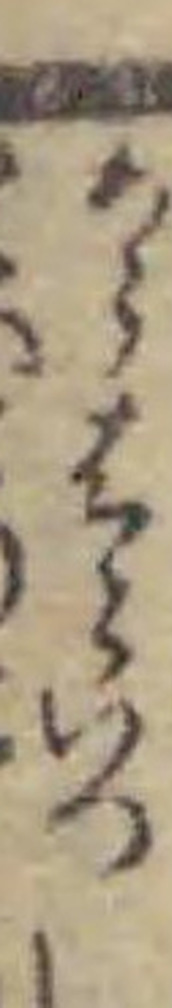からはといつ
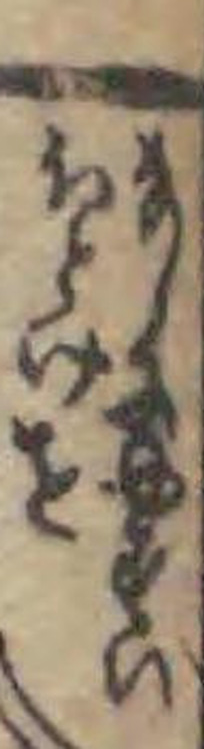ほとけを
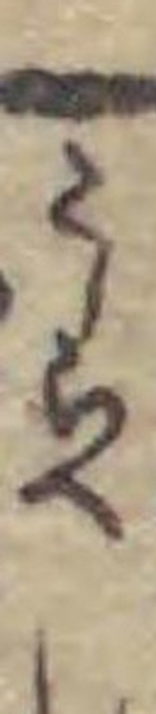こしらへ
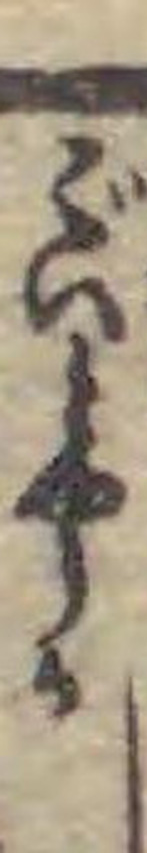ごいとやらか
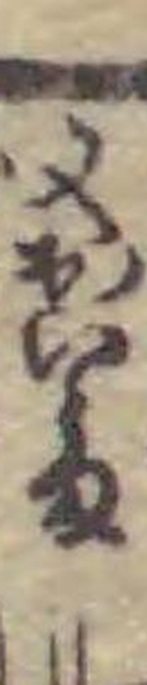又おいとま
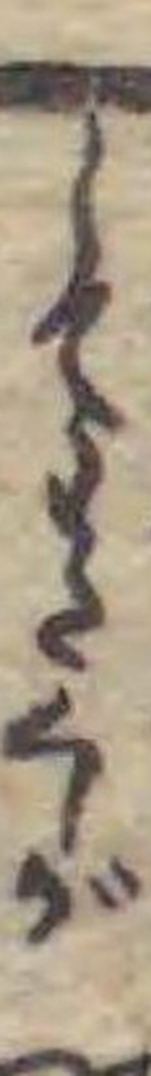してわたくしが
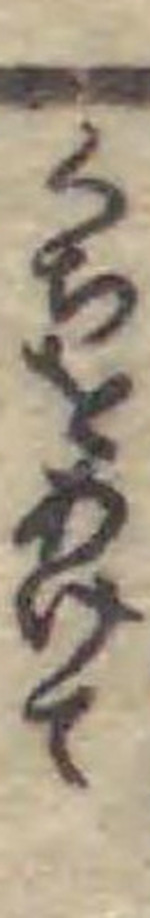くちをあけて
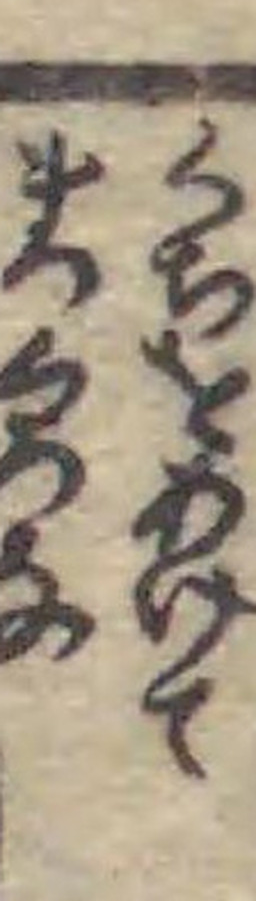まつくろな
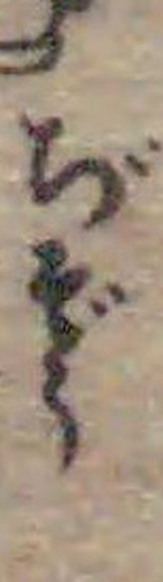ぢぞう
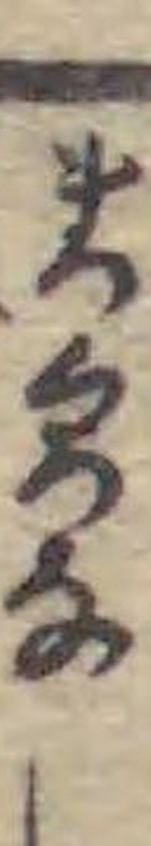まつくろな
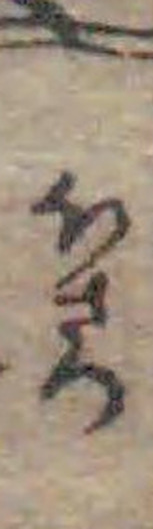ほさつ
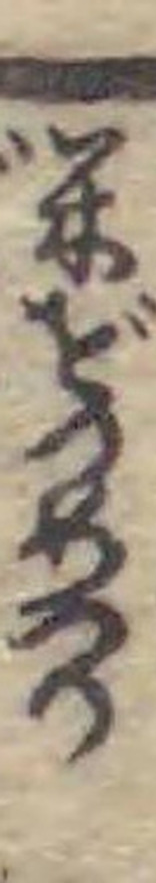米ごとつめつり
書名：紙屑身上噺 : 3巻
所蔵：国立国会図書館 National Diet Library, JAPAN
